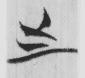之
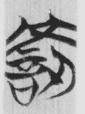罰
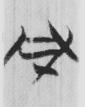凡
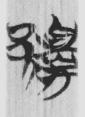{臱阝}
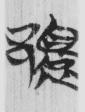{睘阝}
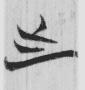之
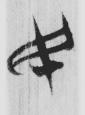民
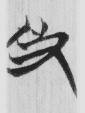及
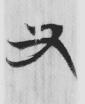又
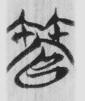管
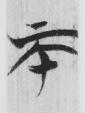帀
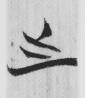之
